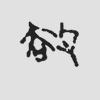去
